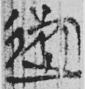○（旅）
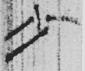少（小）
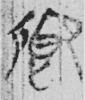卿（亨）
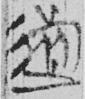○（旅）
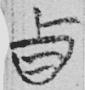貞
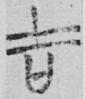吉
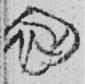初
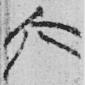○（旅）
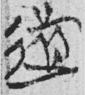○（瑣）
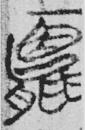瑣瑣
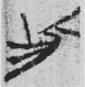此
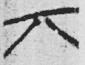亓（其）
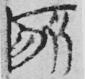所
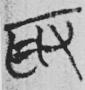取
